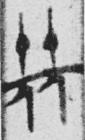堯
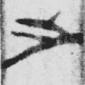之
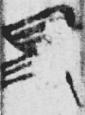○（得）
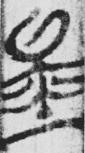○（舜）
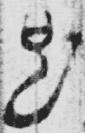也
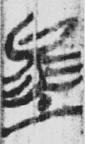○（舜）
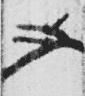之
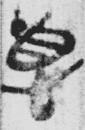惪（德）
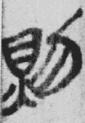則（則）
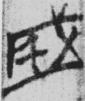城（誠）
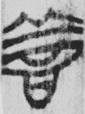善
